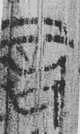言
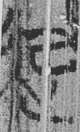○（起）
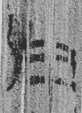於
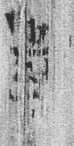○（一）
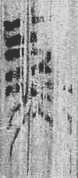耑（端）
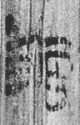○（聞）
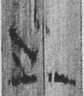之
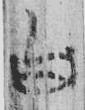曰
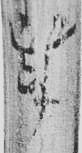○（一）
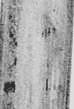生
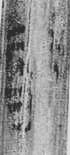兩
